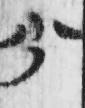少
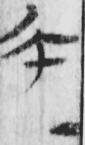帀（師）
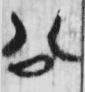公
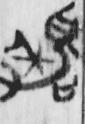嘉
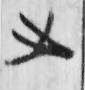之
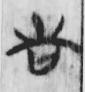告
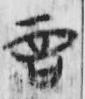言
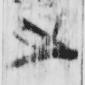之
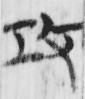攻
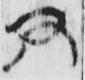尹
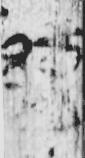○（复）
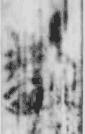○（荆）
